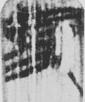○（得）
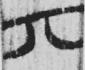亓（其）
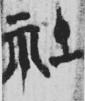社
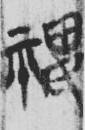禝
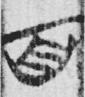百
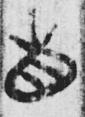眚（姓）
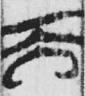而
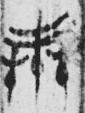奉
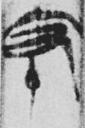守
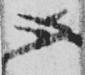之
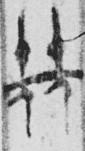堯
